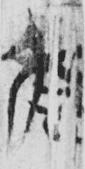年
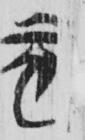而
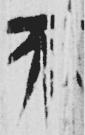天
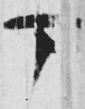下
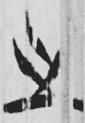之
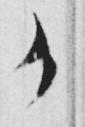人
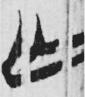亡（無）
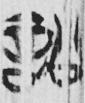訟
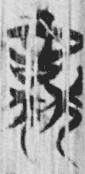獄
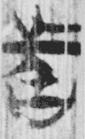者
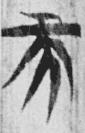天
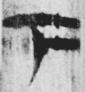下
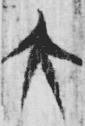大
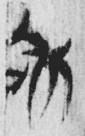和
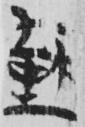均
